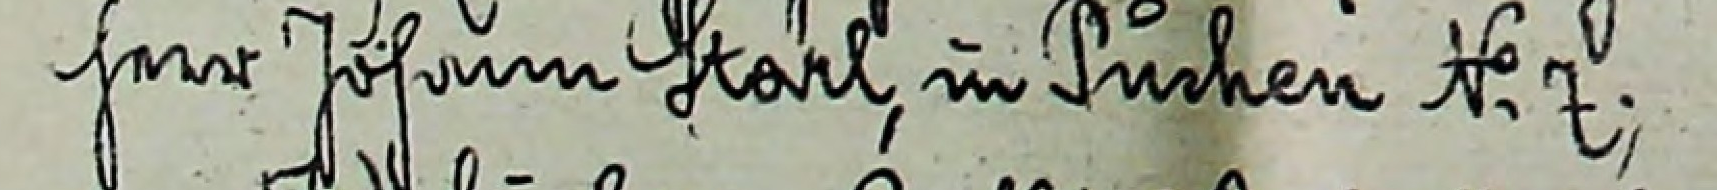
Herr Johann Starl, in Puchen No 7;
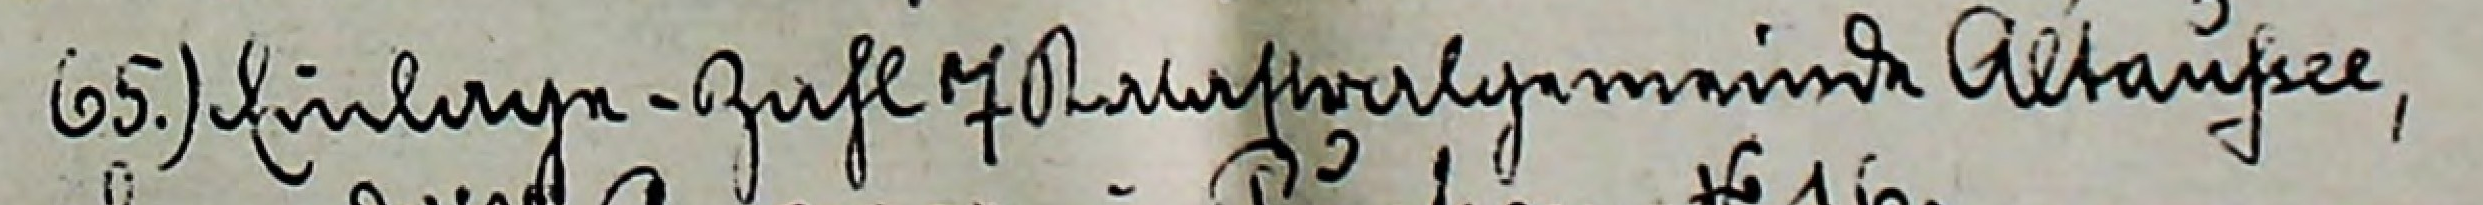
65.) Einlage - Zahl 7 Katastralgemeinde Altaussee,
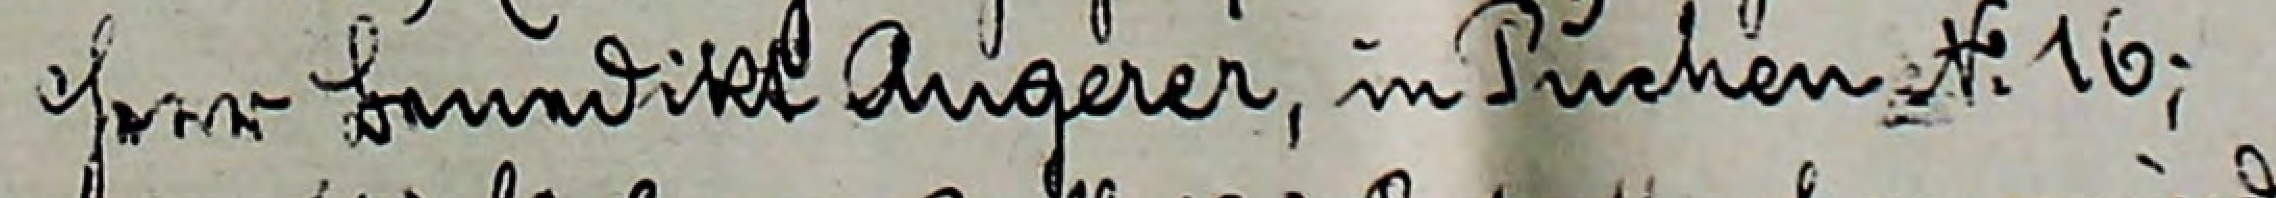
Herr Benedikt Angerer, in Puchen No 16;
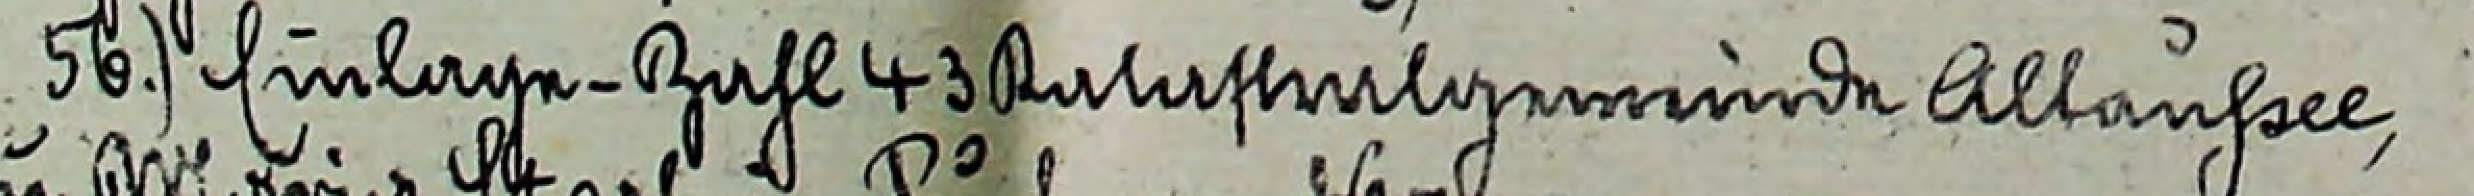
56.) Einlage - Zahl 43 Katastralgemeinde Altaussee,
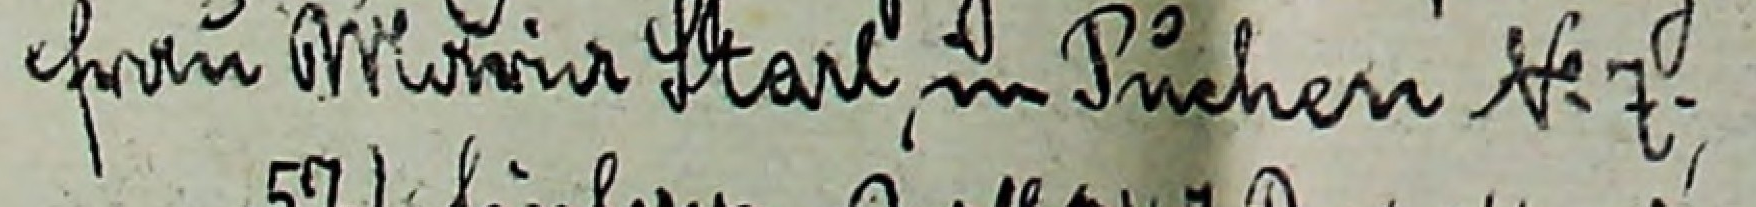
Frau Maria Starl, in Puchen No 7;
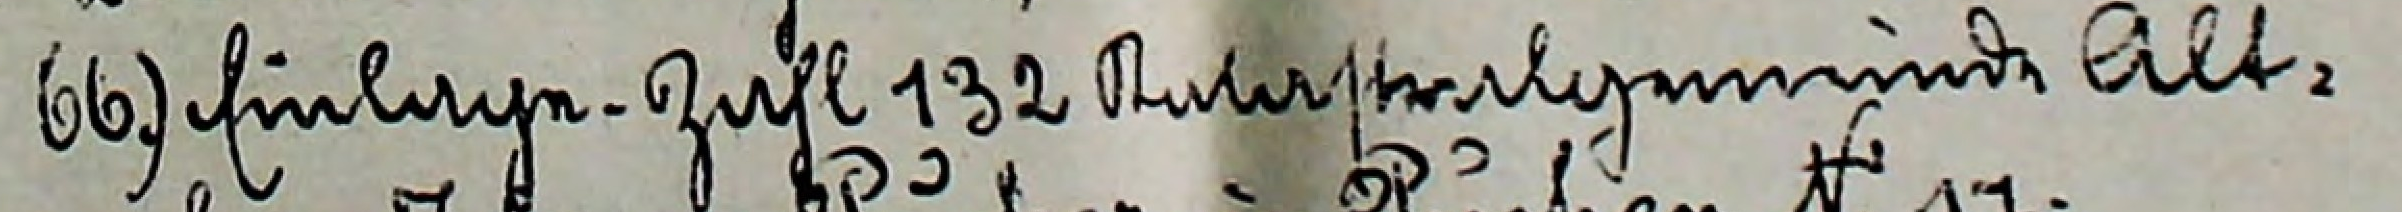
66.) Einlage - Zahl 132 Katastralgemeinde Alt=
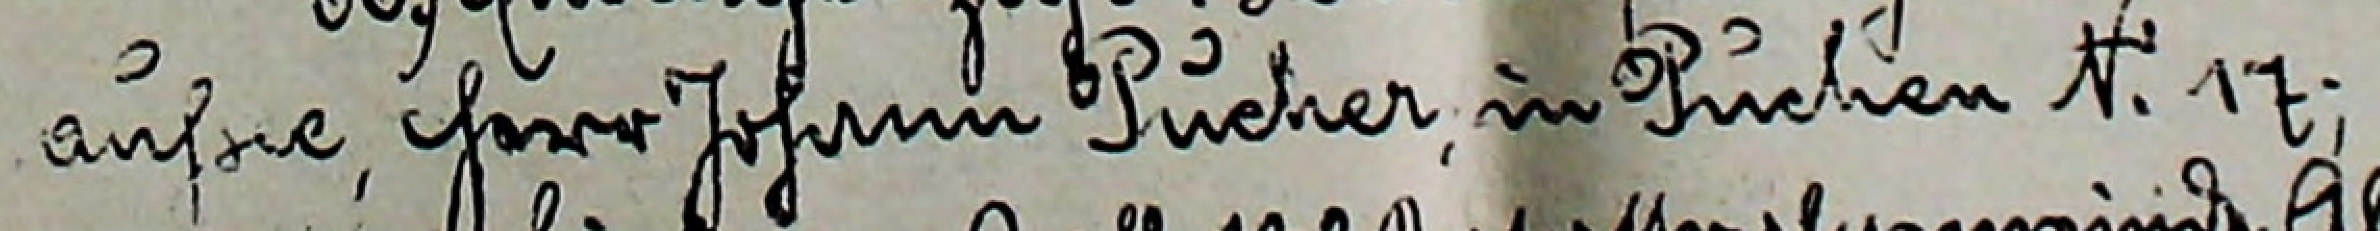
aussee, Herr Johann Pucher, in Puchen No 17;
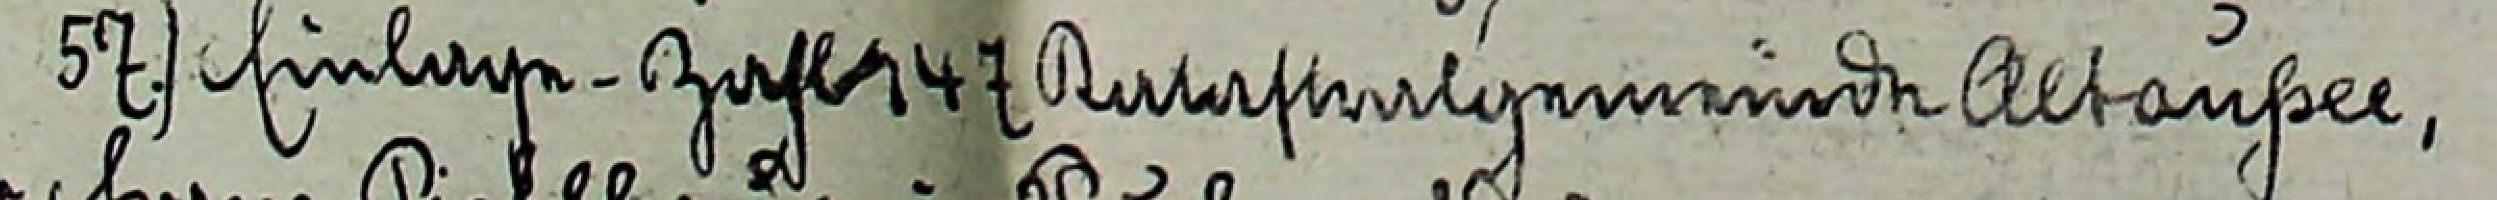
57.) Einlage - Zahl 47 Katastralgemeinde Altaussee,
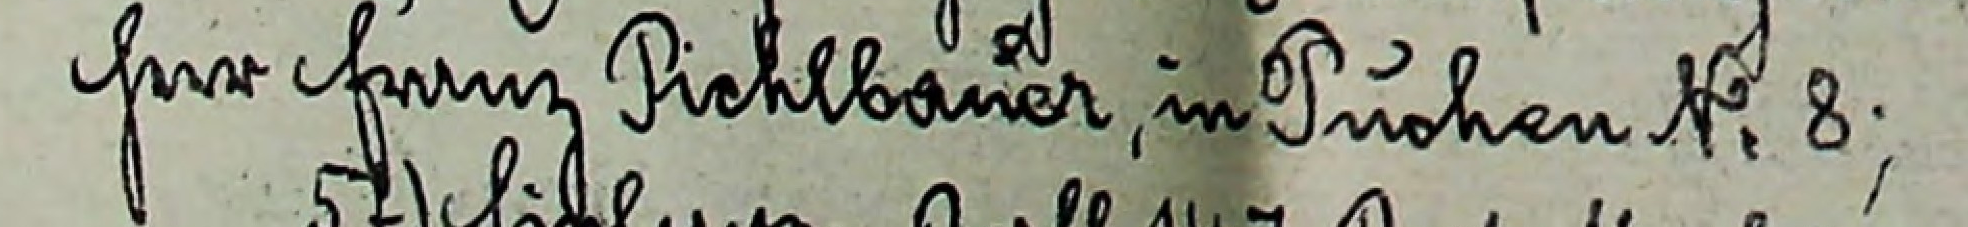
Herr Franz Pichlbauer, in Puchen No 8;
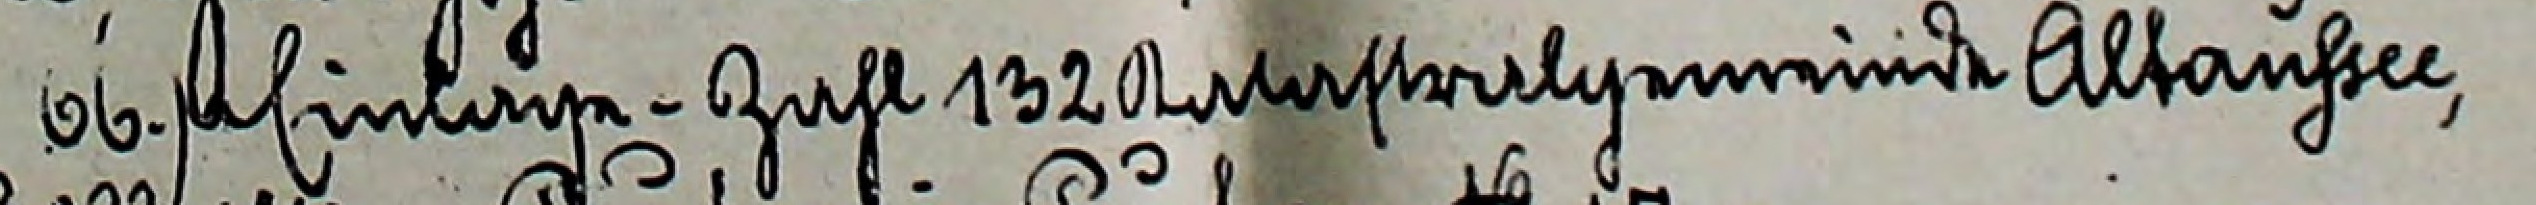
66.) Einlage - Zahl 132 Katastralgemeinde Altaussee,
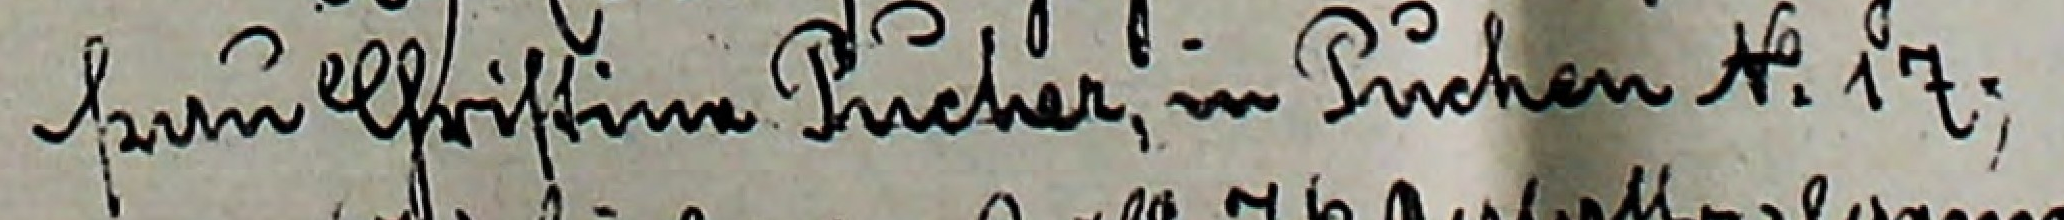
Frau Christine Pucher, in Puchen No 17;
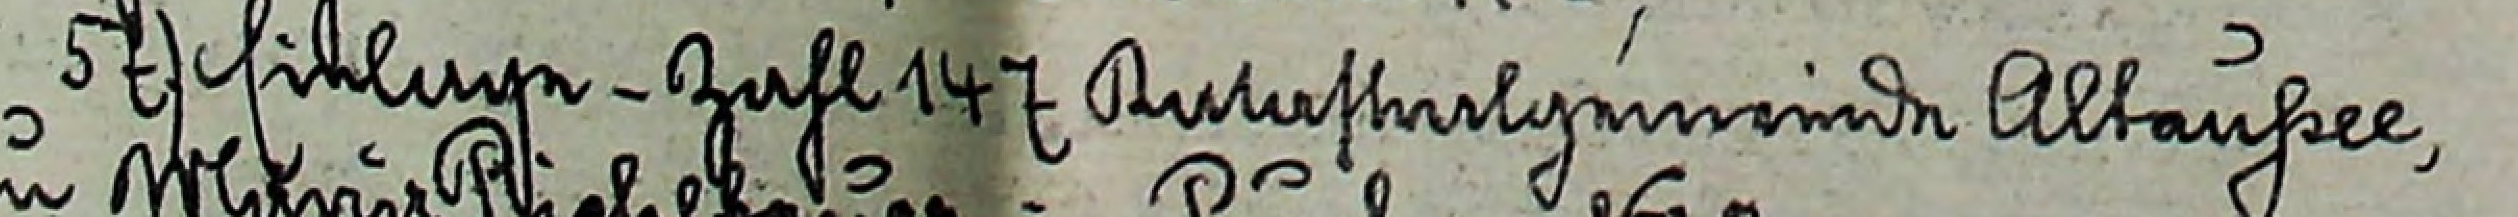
57.) Einlage - Zahl 147 Katastralgemeinde Altaussee,
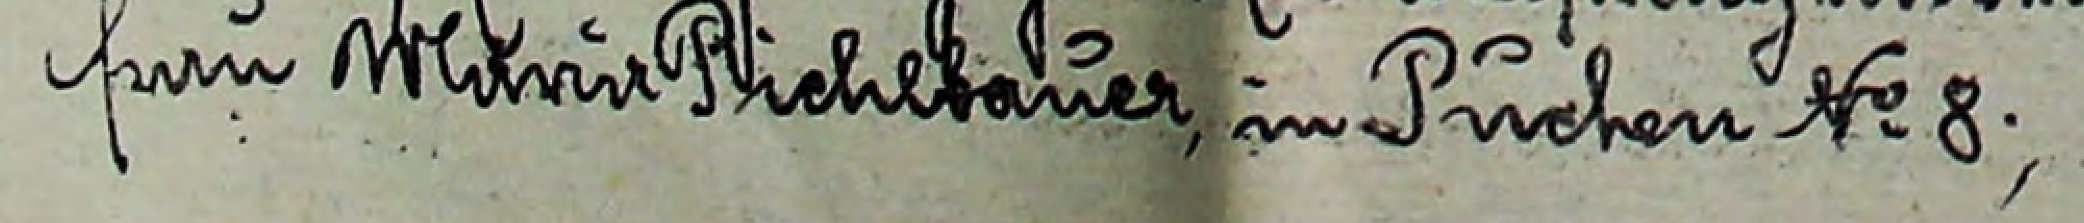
Frau Maria Pichlbauer, in Puchen No 8;
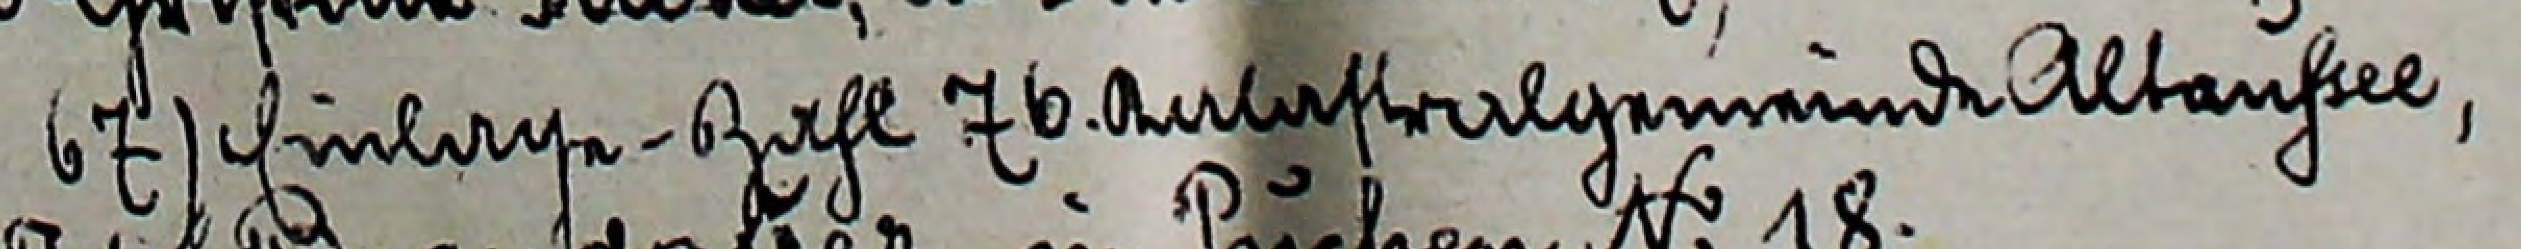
67) Einlage - Zahl 76. Katastralgemeinde Altaussee,
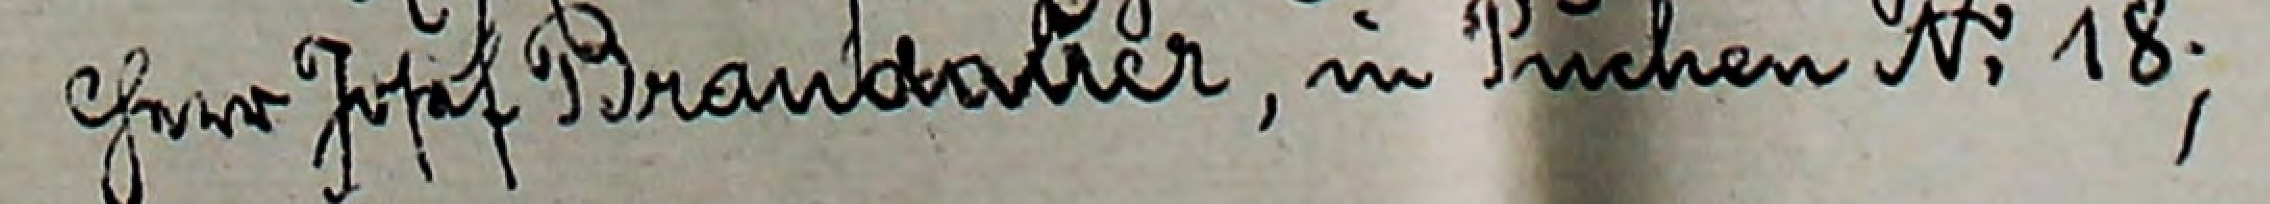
Herr Josef Brandauer, in Puchen No 18;
